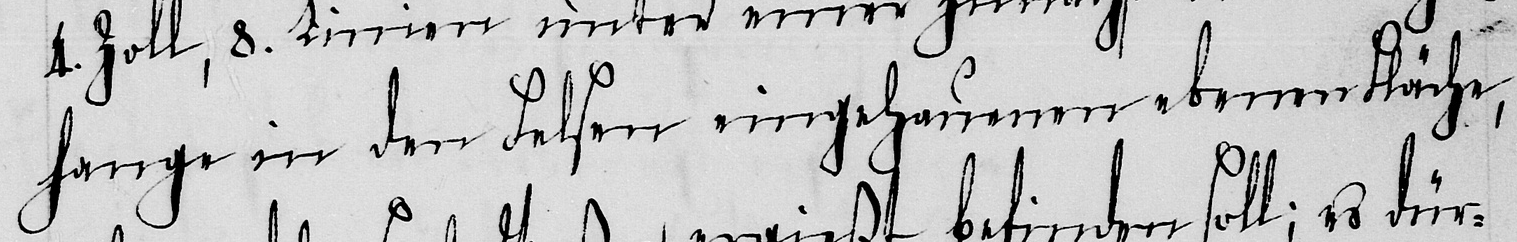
hange in den Felsen eingehauenen ebenen Fläche,
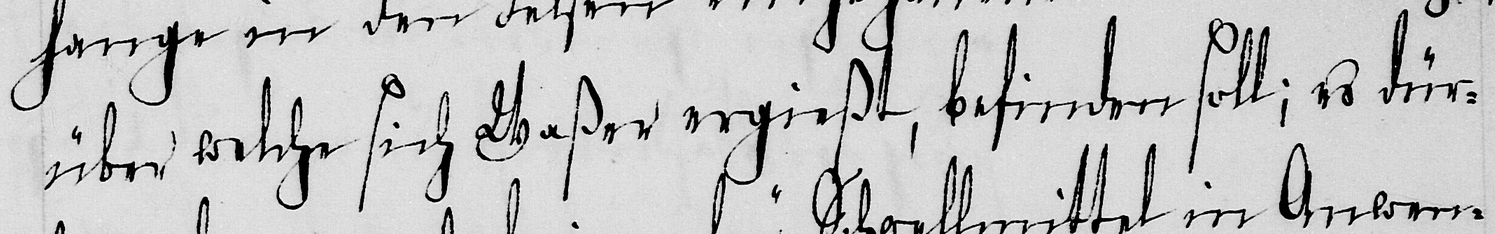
über welche sich Waßer ergießt, befinden soll; es dür¬
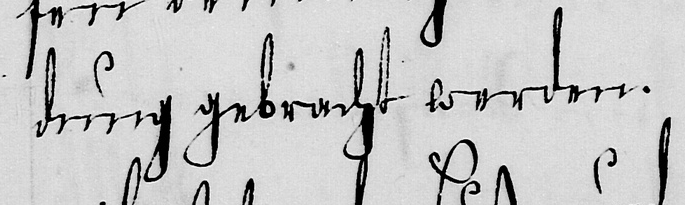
dung gebracht werden.
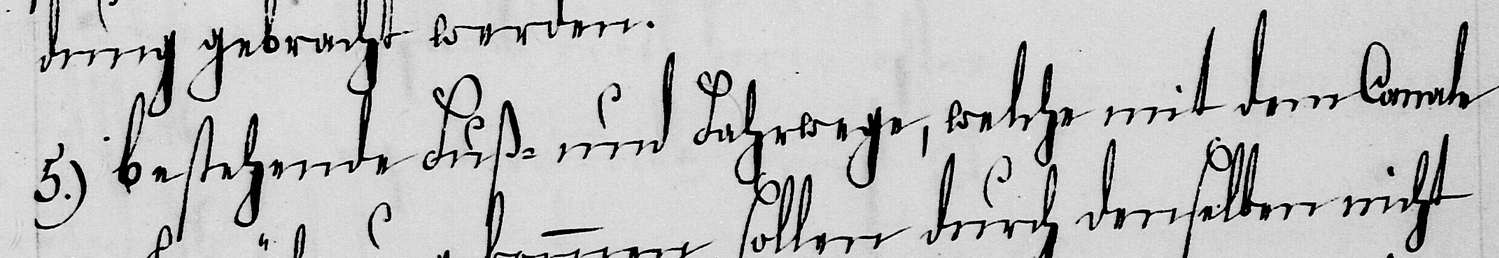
5.) bestehende Fuß- und Fahrwege, welche mit dem Canale
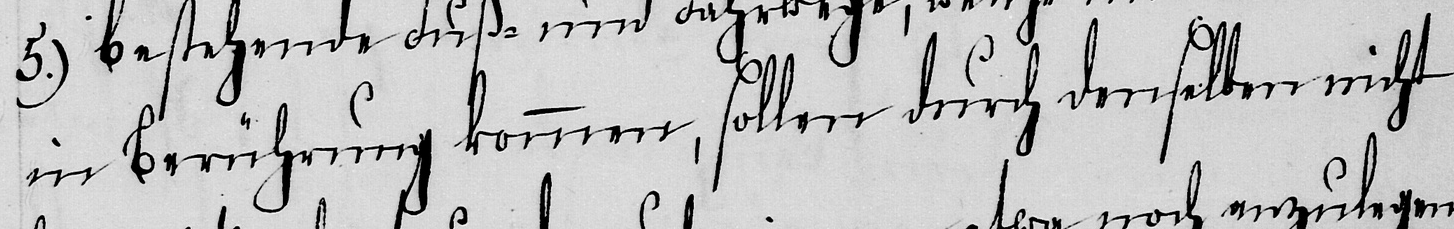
in Berührung kommen, sollen durch denselben nicht
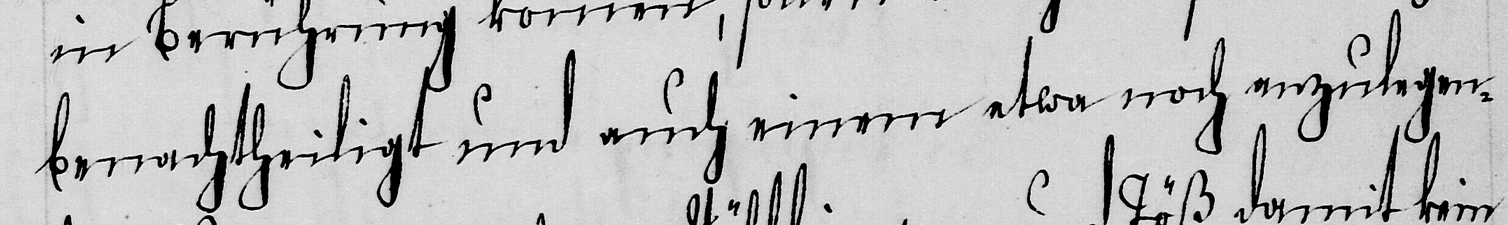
benachtheiligt und auch einem etwa noch anzulegen¬
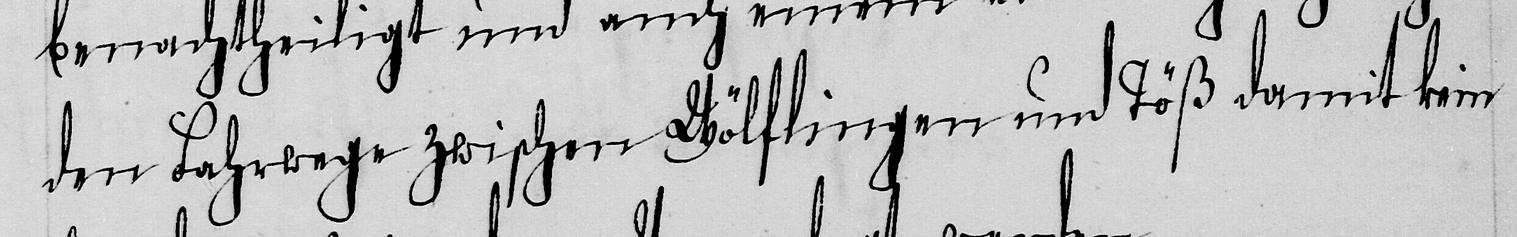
den Fahrwege zwischen Wölflingen und Töß damit kein
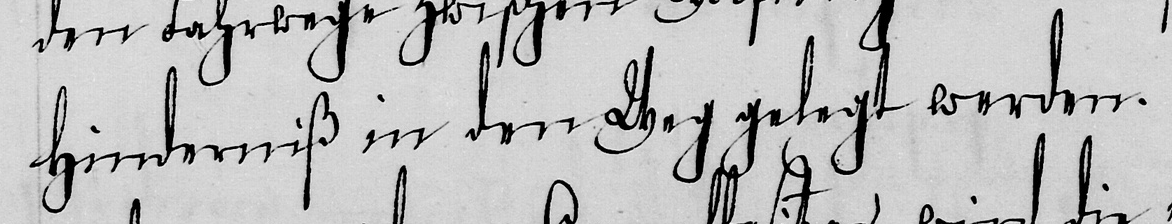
Hinderniß in den Weg gelegt werden.
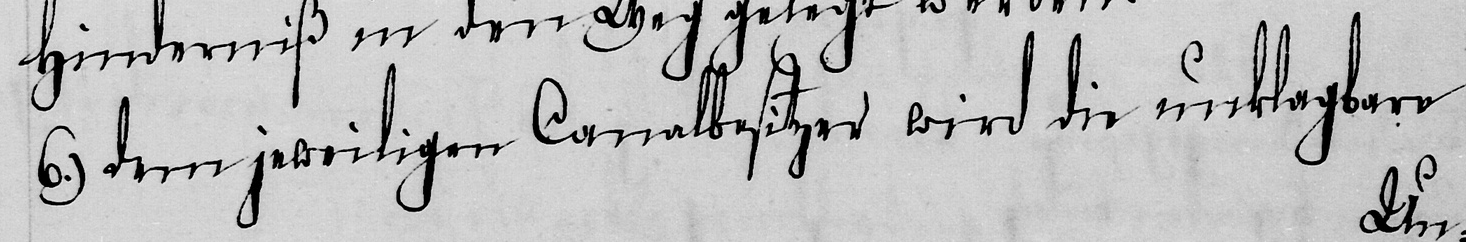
6.) dem jeweiligen Canalbesitzer wird die unklagbare
